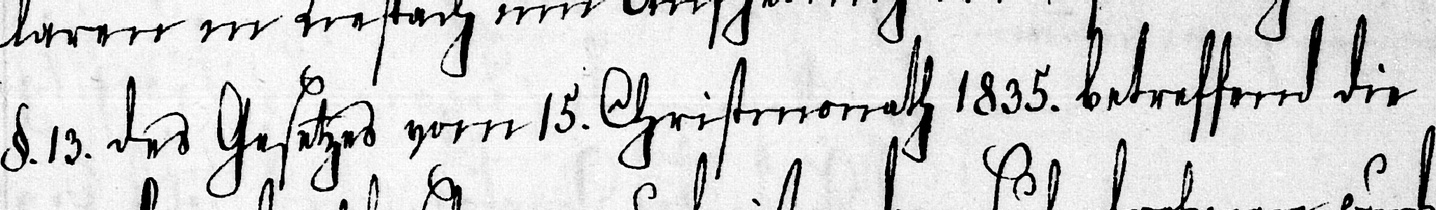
13. des Gesetzes vom 15. Christhmonath 1835. betreffend die
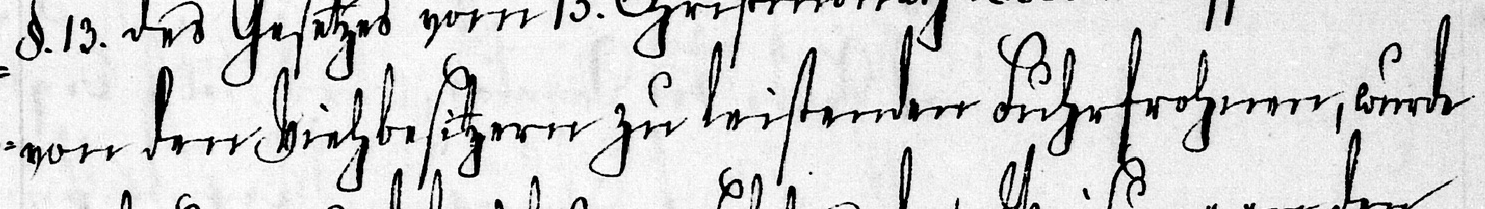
von den Viehbesitzern zu leistenden Fuhrfrohnen, wurde
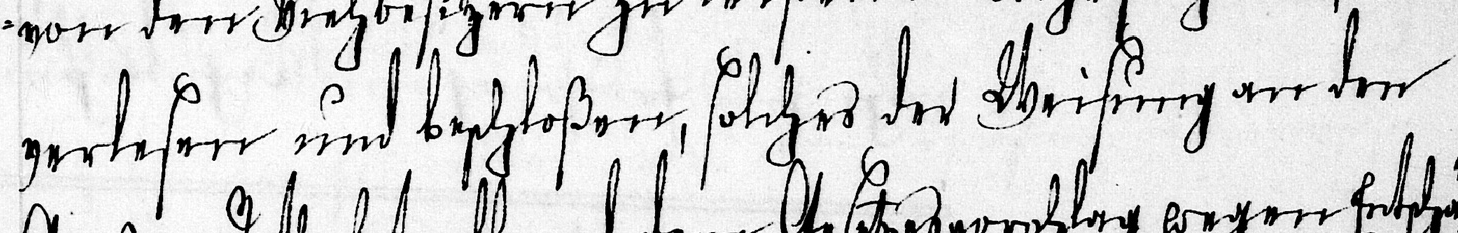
verlesen und beschloßen, solches der Weisung an den
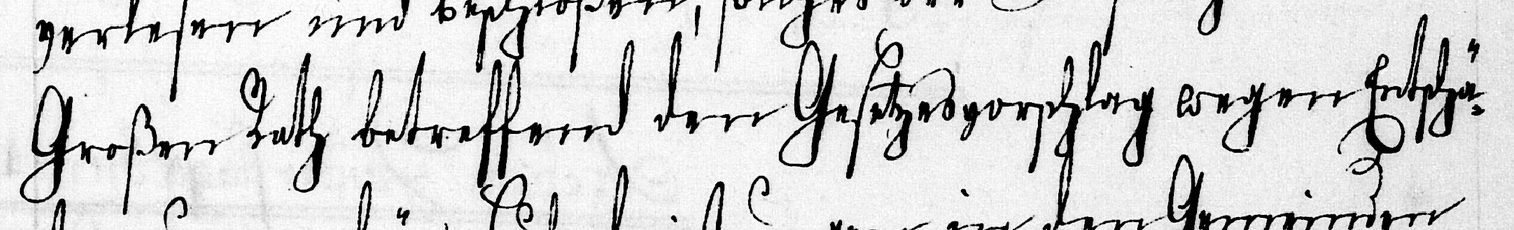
Großen Rath betreffend den Gesetzesvorschlag wegen Entsch¬
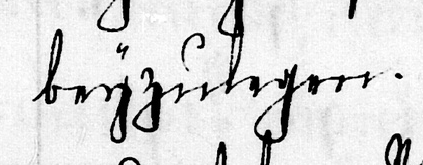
beyzulegen.
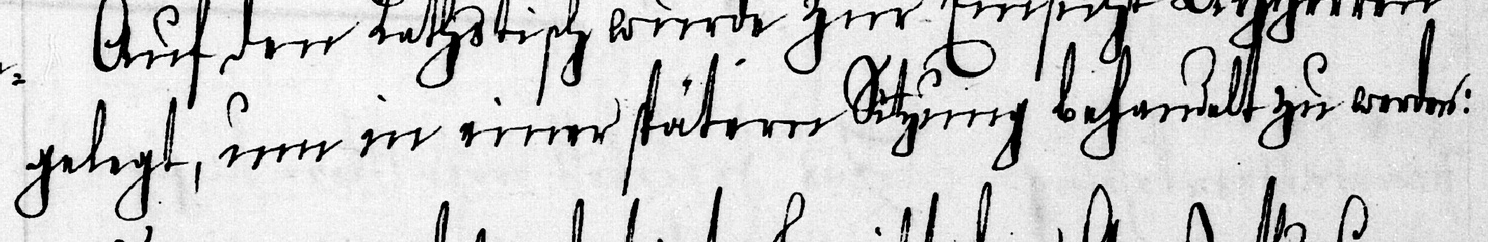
gelegt, um in einer spätern Sitzung behandelt zu werden:
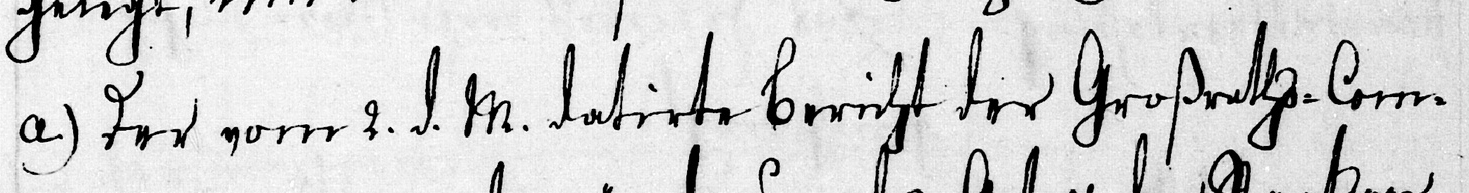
a.) Der vom 2. d. M. datirte Bericht der Großraths-Com¬
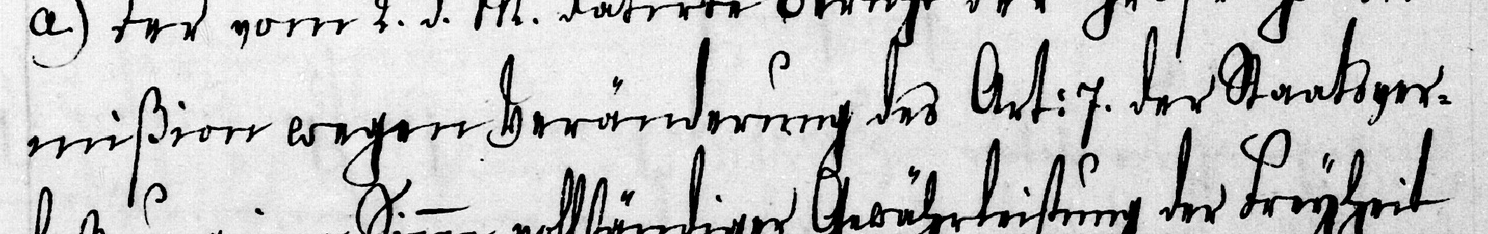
mißion wegen Veränderung des Art: 7. der Staatsver¬
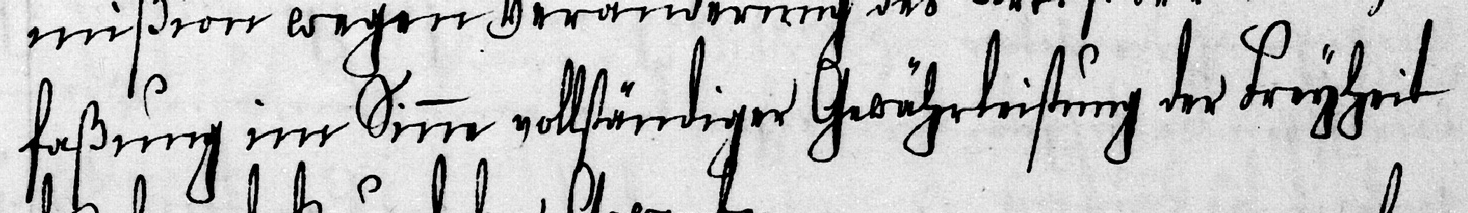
faßung im Sinne vollständiger Gewährleistung der Freyheit
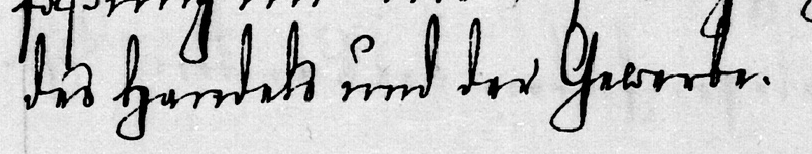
des Handels und der Gewerbe.
